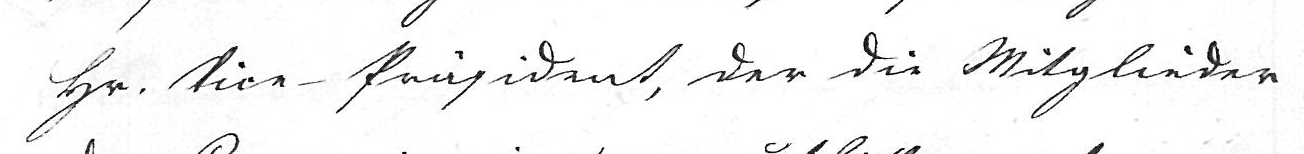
Hr. Vice-Präsident, der die Mitglieder
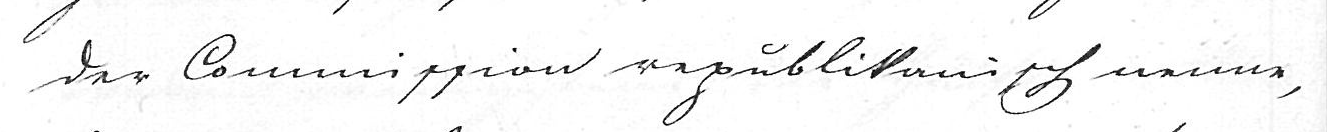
der Commission republikanisch nenne,
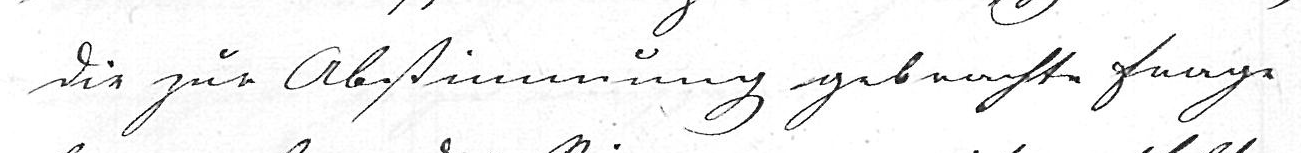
die zur Abstimmung gebrachten Frage
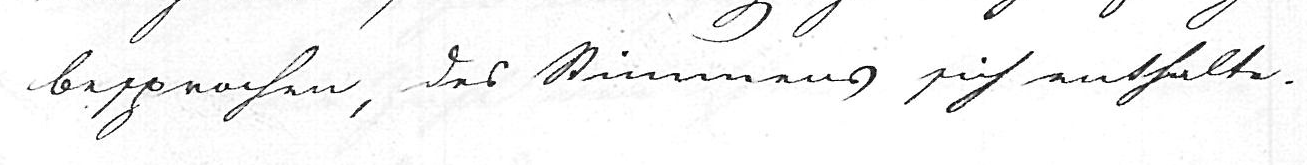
besprochen, des Stimmens sich enthalte.
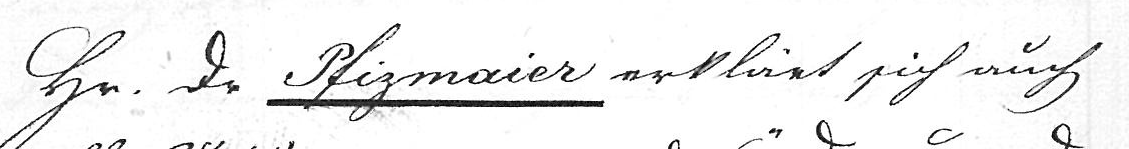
Hr. Dr. Pfizmaier erklärt sich auch
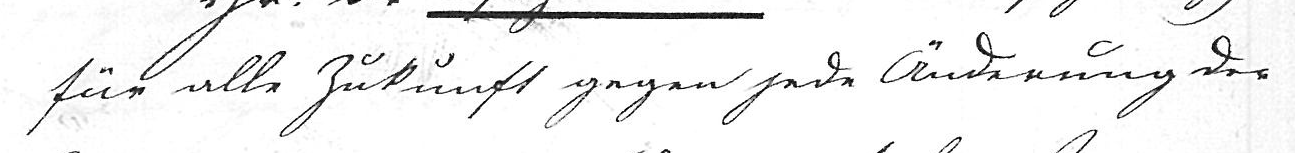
für alle Zukunft gegen jede Änderung der
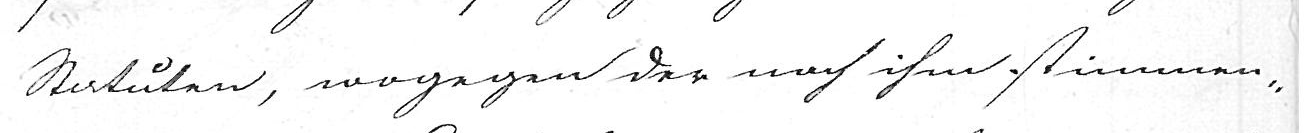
Statuten, wogegen der nach ihm stimmen-
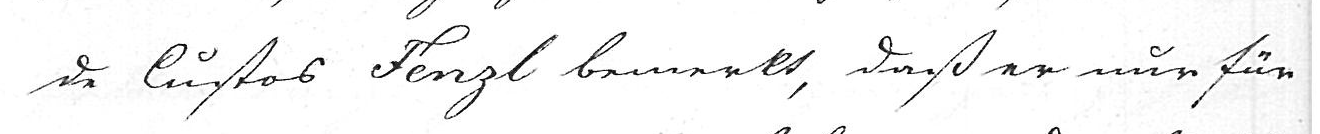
die Custos Fenzl bemerkt, daß er nur für
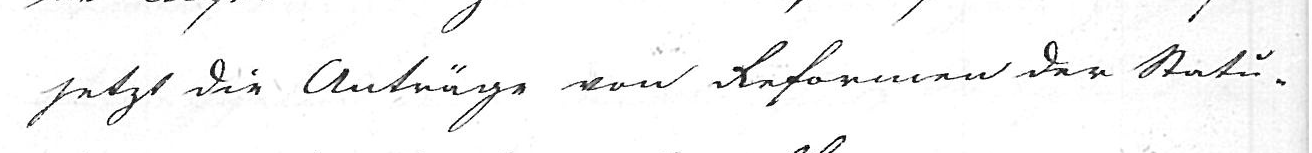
jetzt die Anträge von Reformen der Statu-
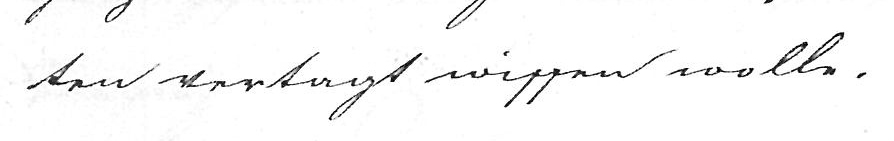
ten vertagt wissen wolle.
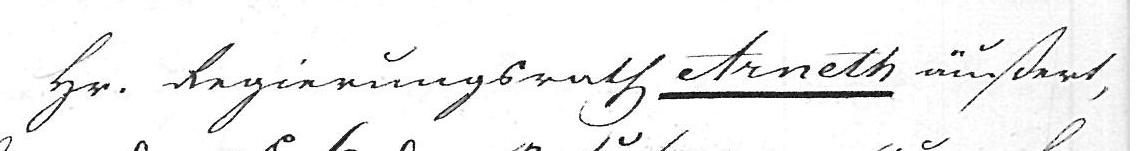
Hr. Regierungsrath Arneth äußert,
